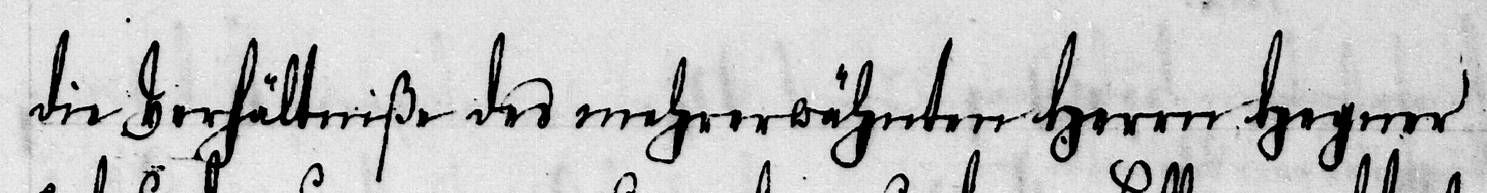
die Verhältniße des mehrerwähnten Herrn Hegner
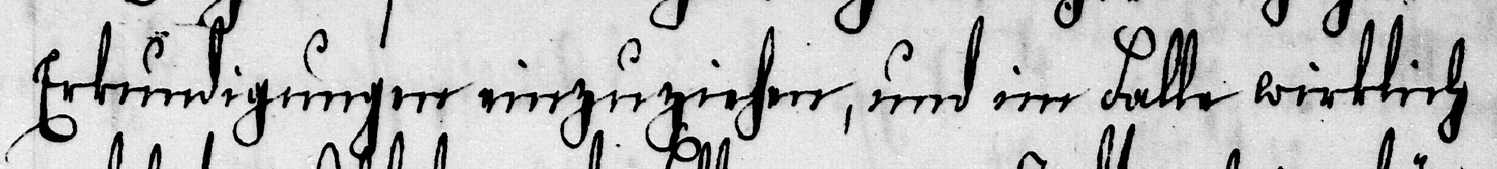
Erkundigungen einzuziehen, und im Falle wirklich
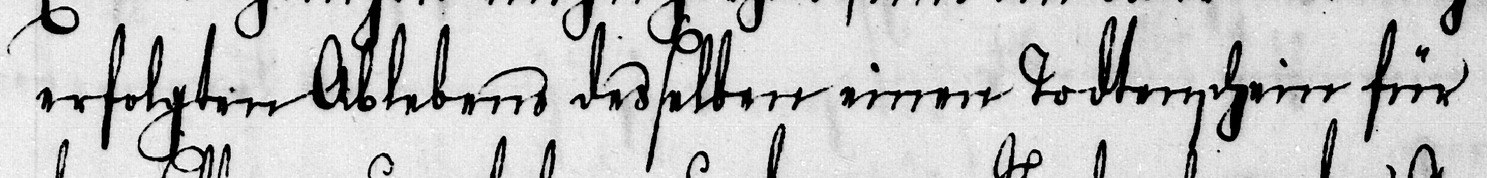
erfolgten Ablebens desselben einen Todtenschein für
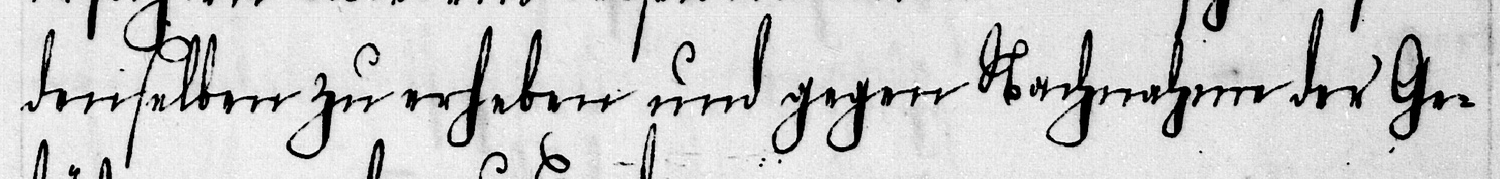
denselben zu erhaben und gegen Nachnahme der Ge¬
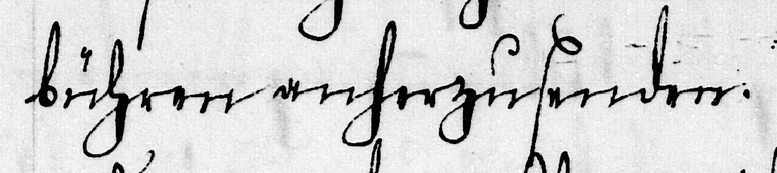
bühren anherzusenden.
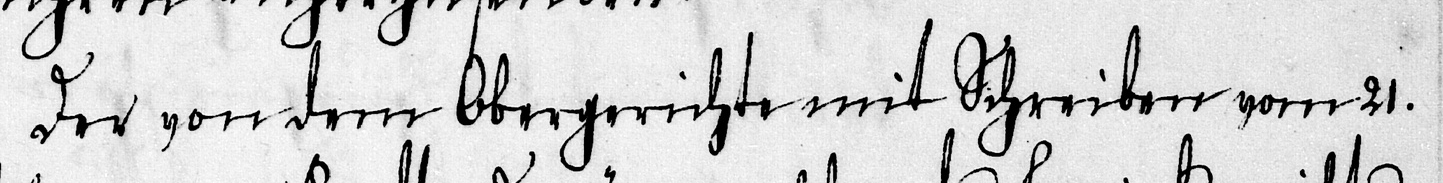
Der von dem Obergerichte mit Schreiben vom 21.
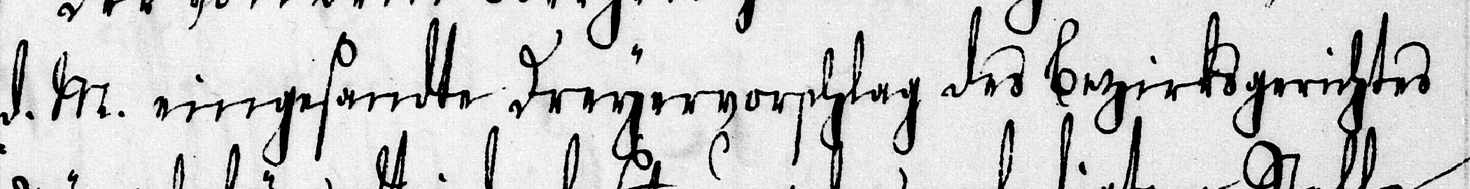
d. M. eingesandte Dreyervorschlag des Bezirksgerichtes
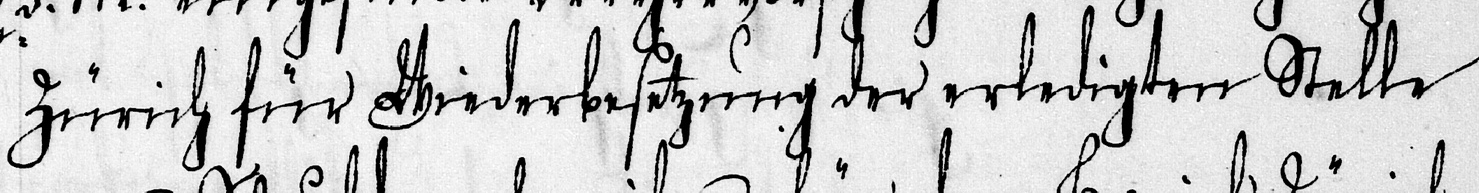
Zürich für Wiederbesetzung der erledigten Stelle
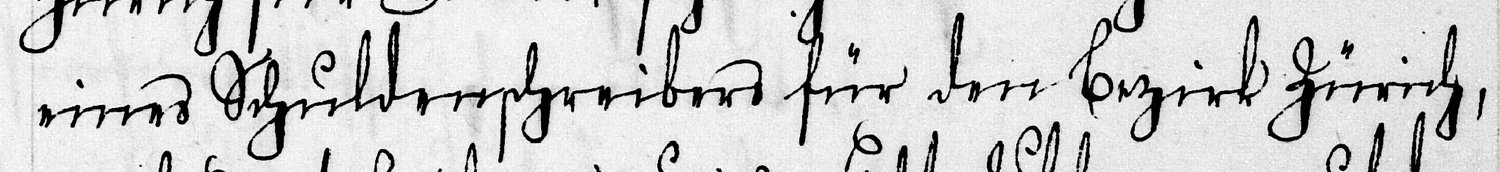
eines Schuldenschreibers für den Bezirk Zürich,
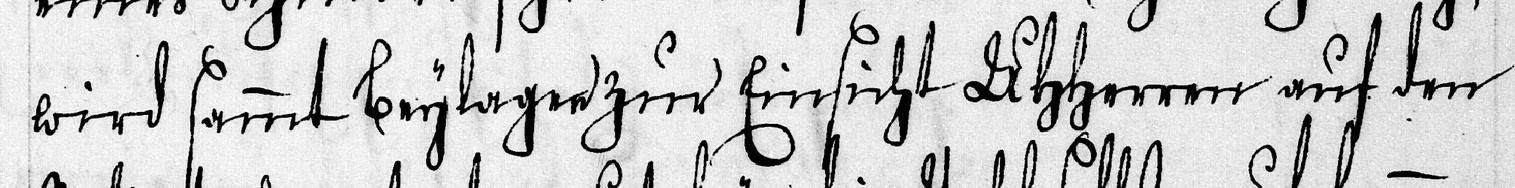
wird sammt Beylagen zur Einischt UHHerren auf den
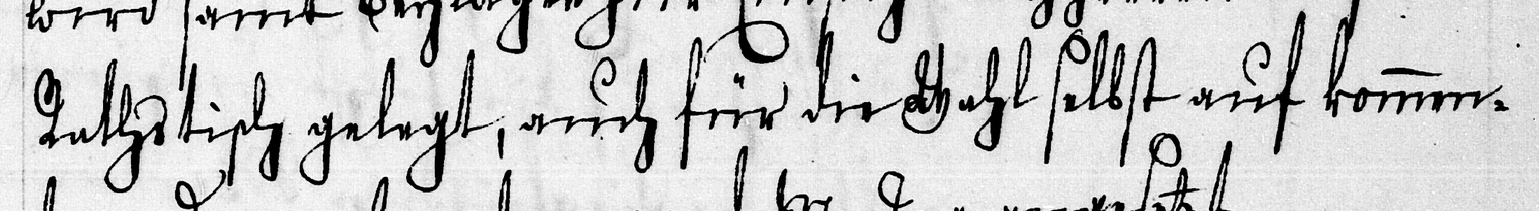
Rathstisch gelegt, auch für die Wahl selbst auf kommen¬
